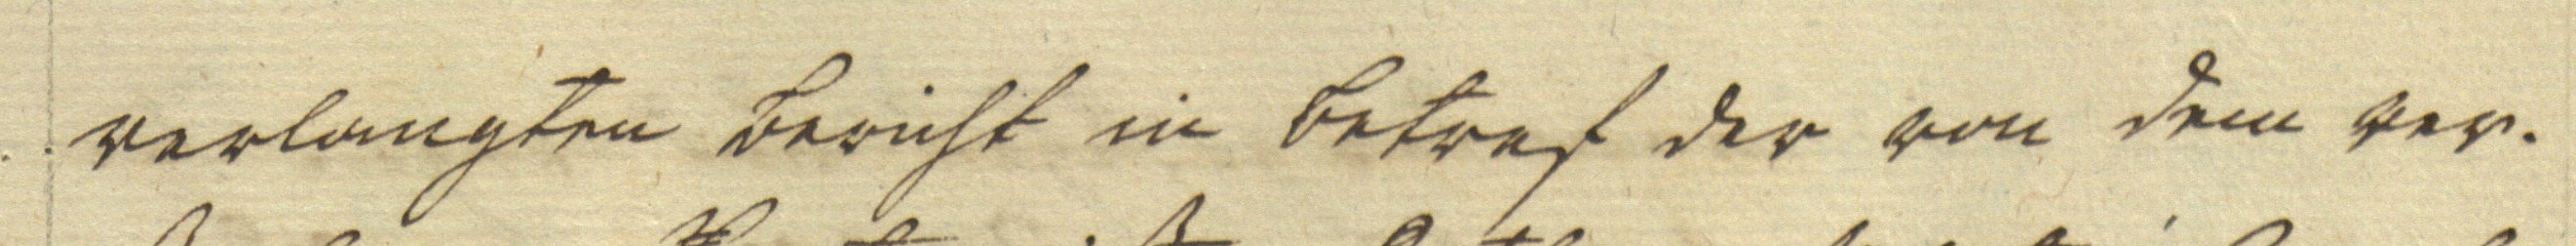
verlangten Bericht in Betref der von dem ver¬
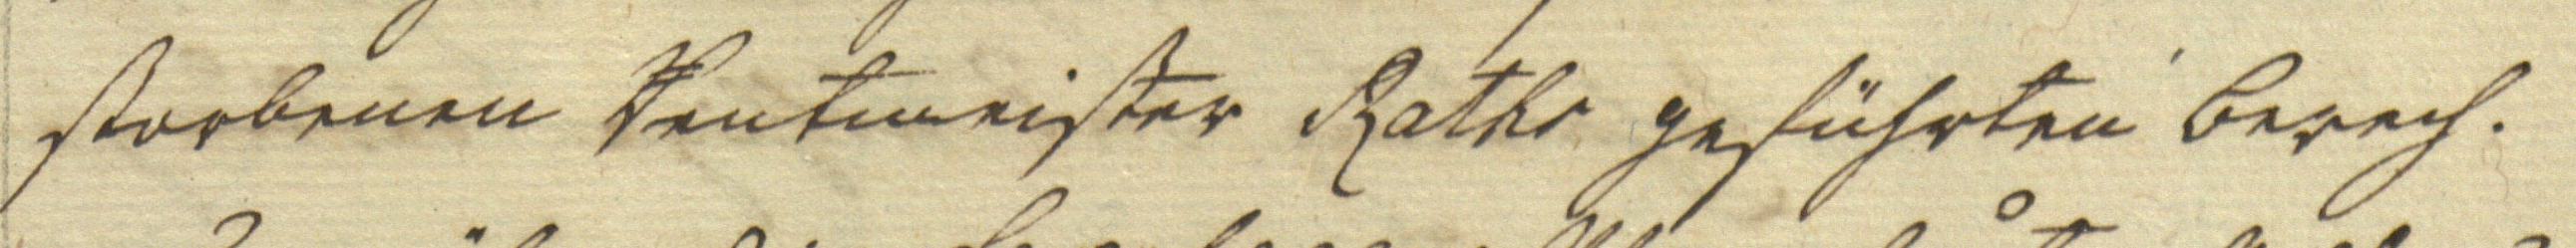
storbenen Rentmeister Raths geführten Berech¬
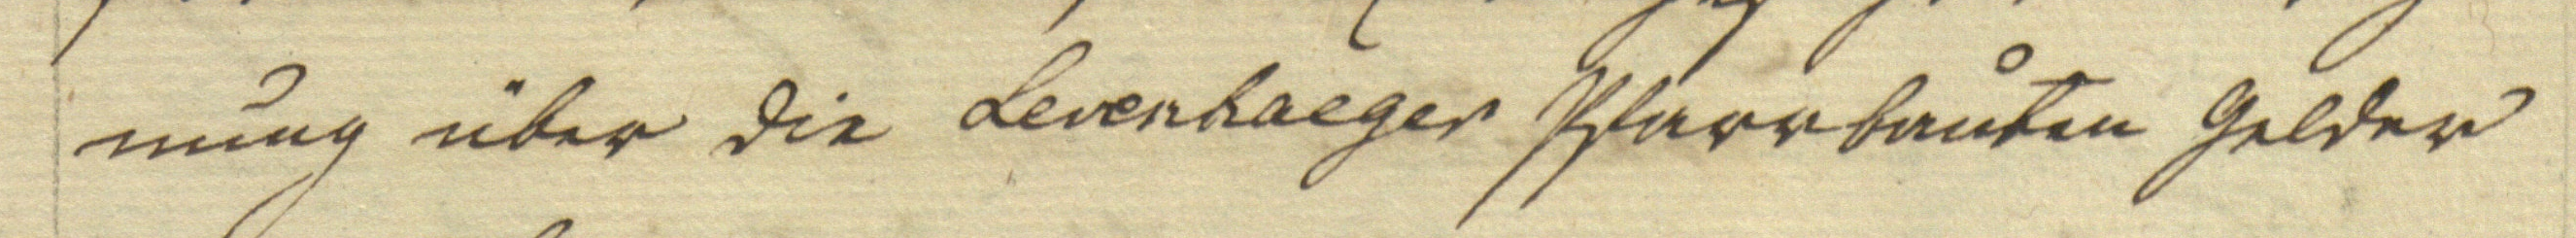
nung über die Levenhaeger Pfarrbauten Gelder
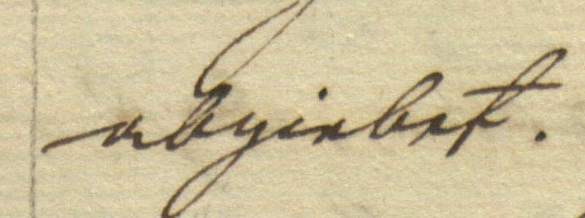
abgiebet.
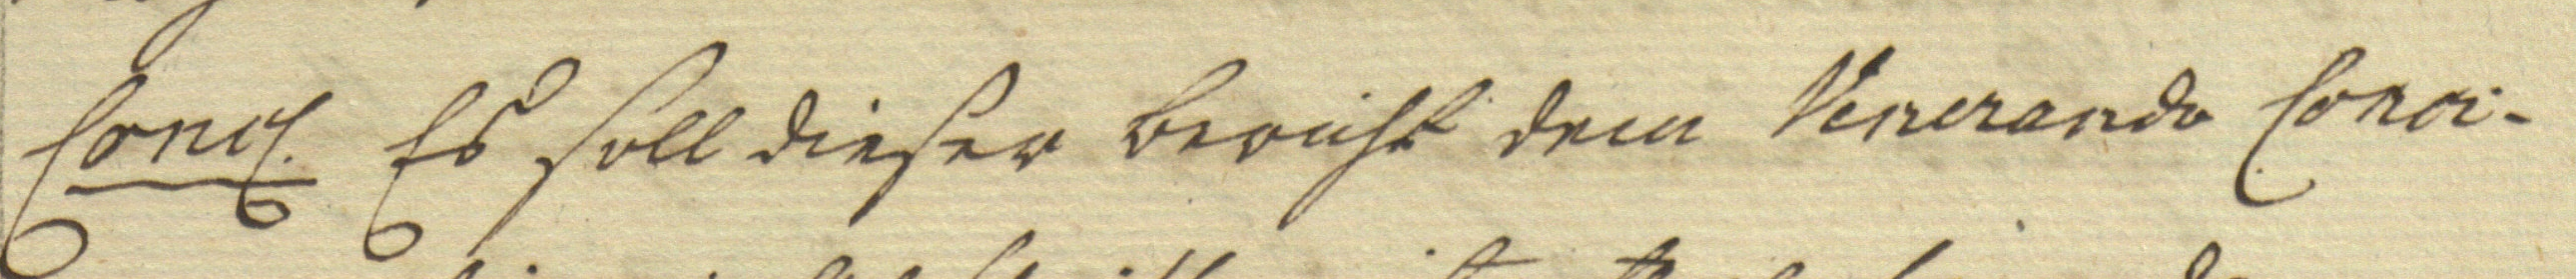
Concl. Es soll dieser Bericht dem Venerando Conci¬
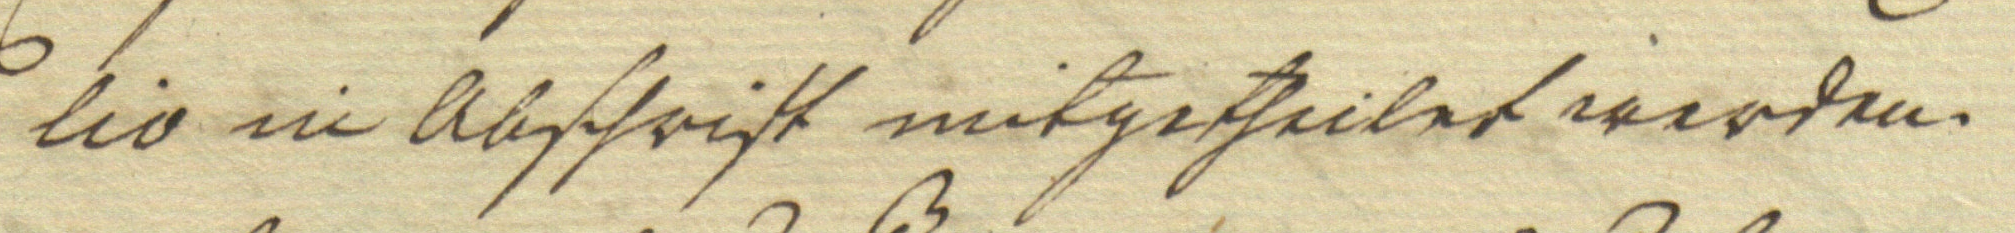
lio in Abschrift mitgetheilet werden.
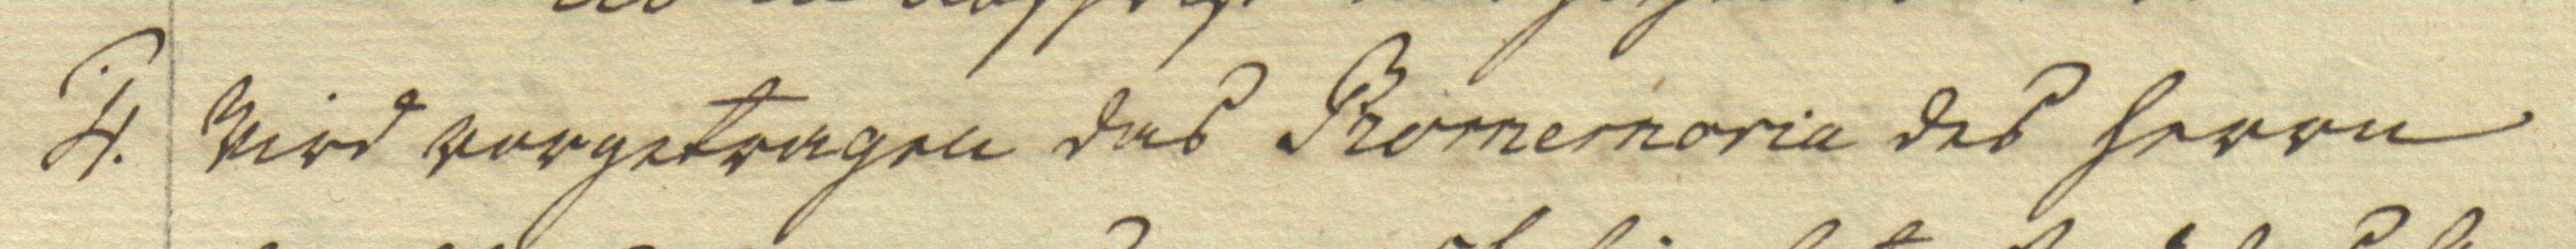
4. Wird vorgetragen das Promemoria des Herrn
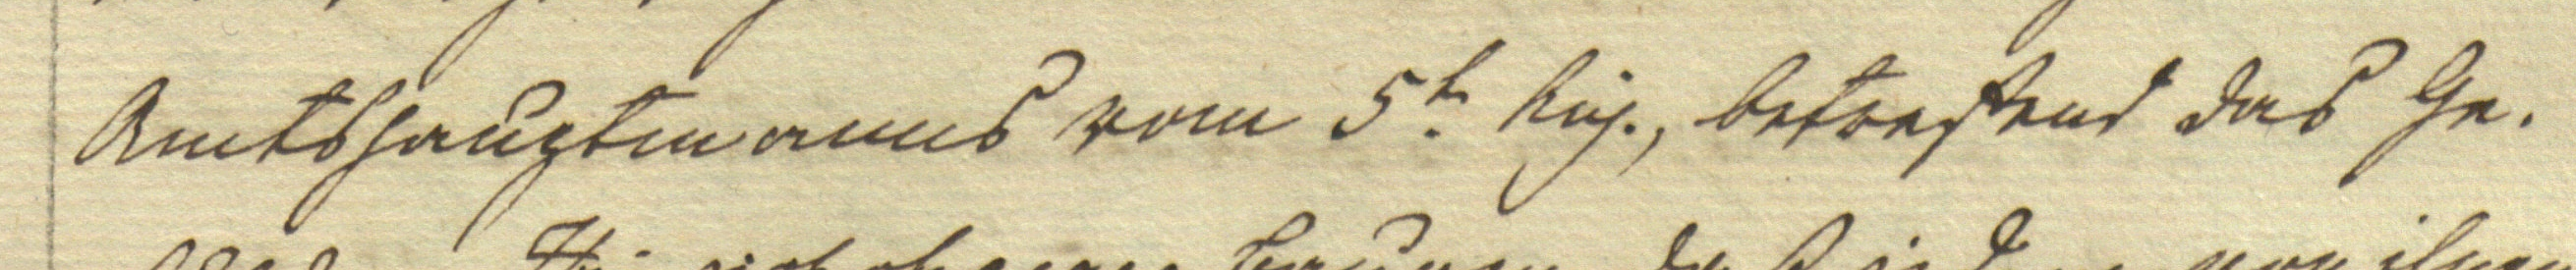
Amtshauptmanns vom 5 t. huj. betreffend das Ge¬
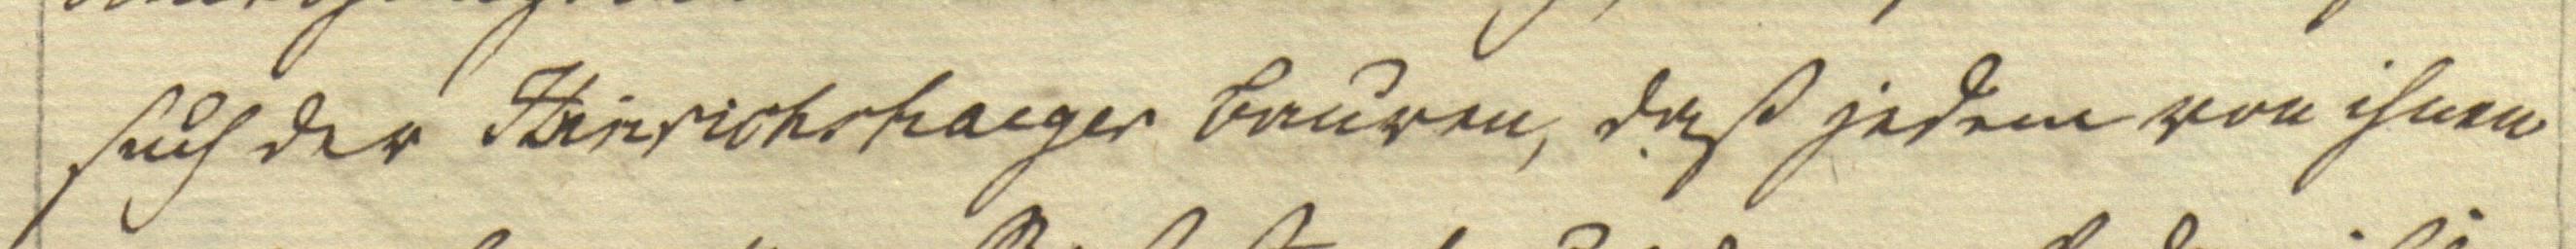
such der Hinrichshaeger Bauren, daß jedem von ihnen
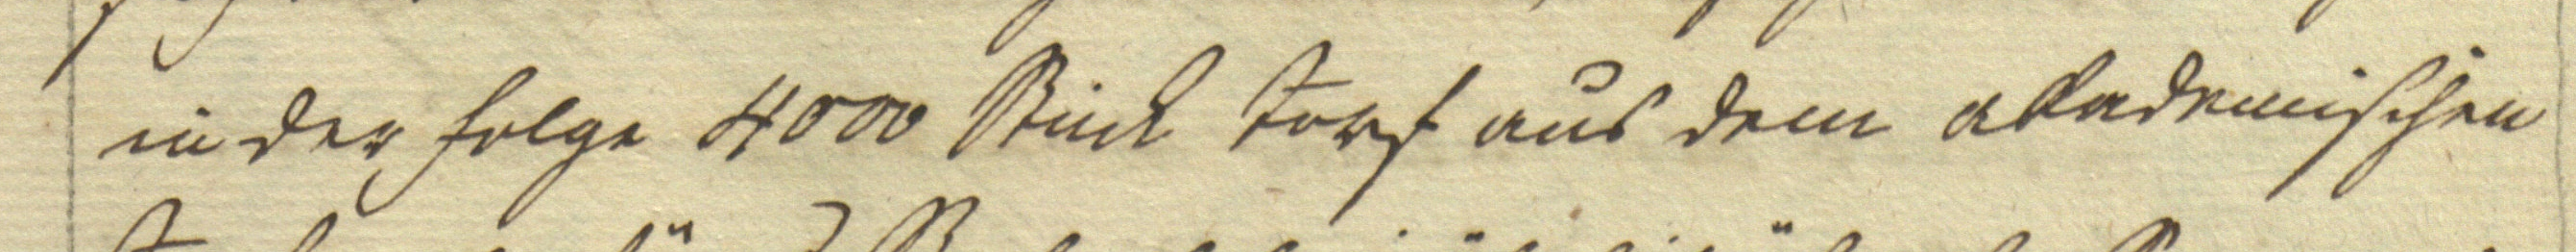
in der Folge 4000 Stück Torf aus dem akademischen
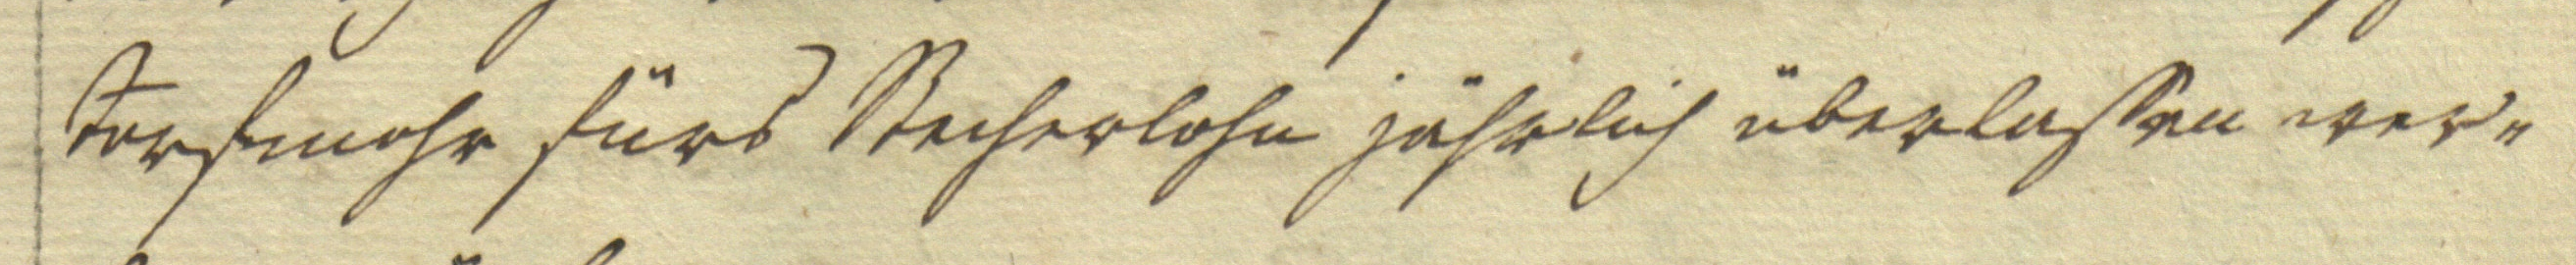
Torfmohr fürs Stecherlohn jährlich überlassen wer¬
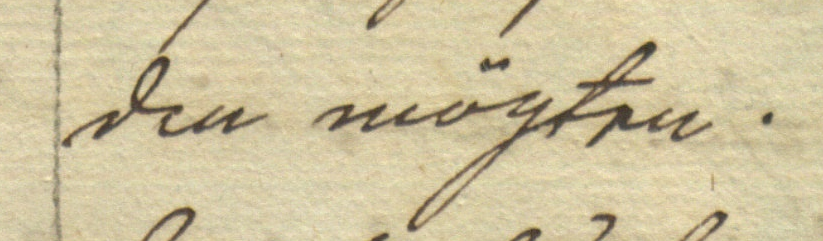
den mögten.
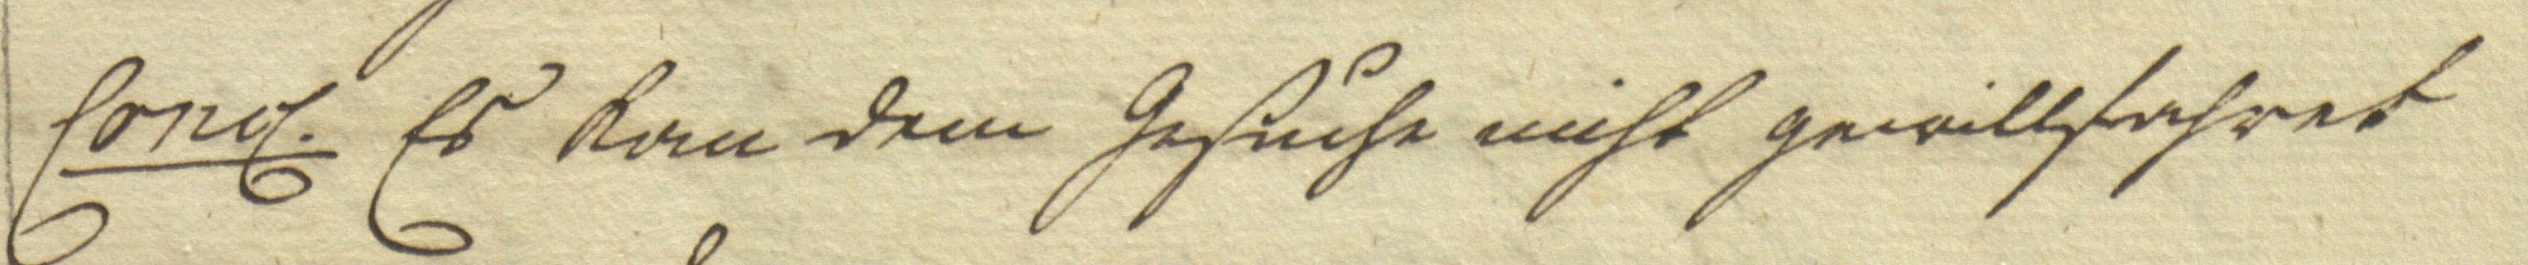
Concl. Es kan dem Gesuche nicht gewillfahret
